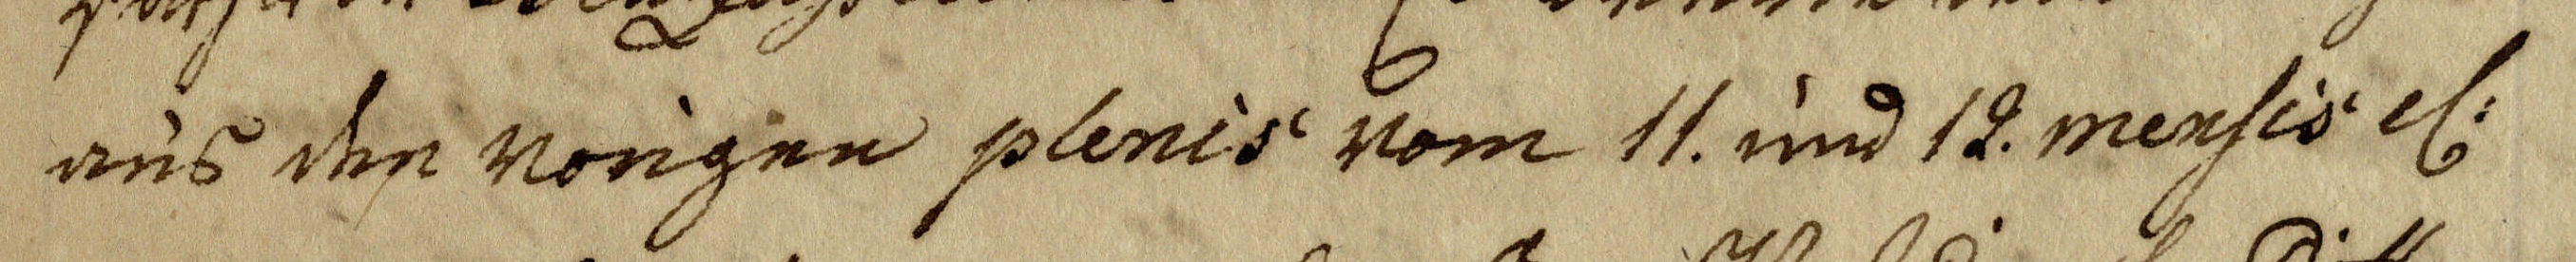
aus den vorigen plenis vom 11. und 12 mensis el.
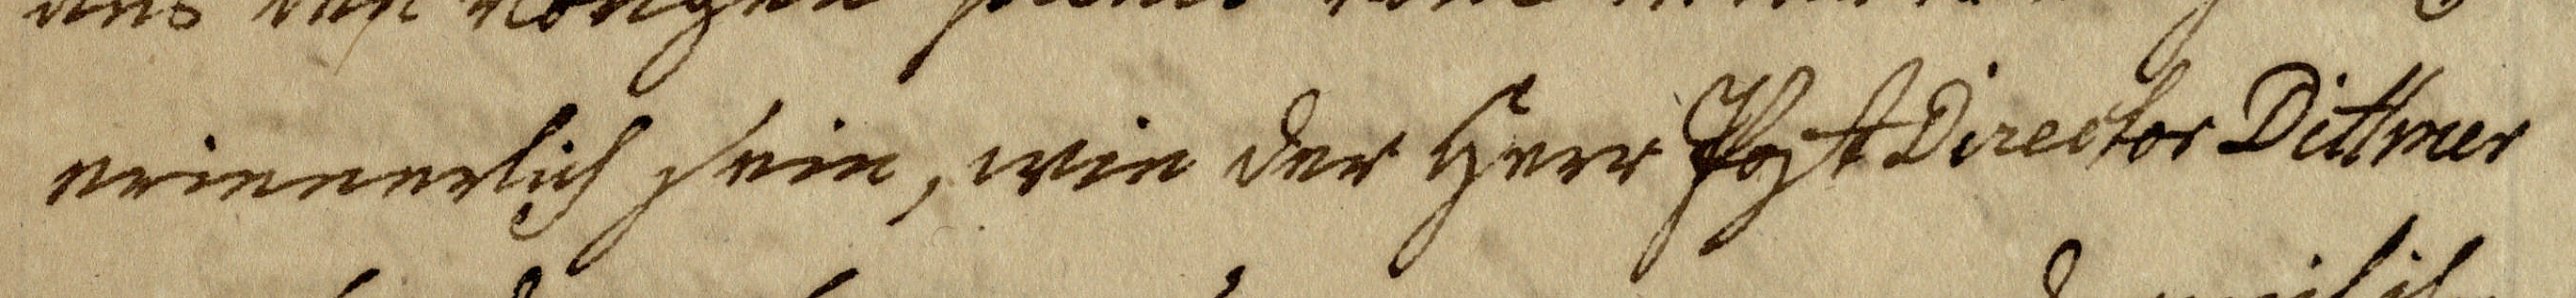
erinnerlich sein, wie der Herr PostDirector Dittmer
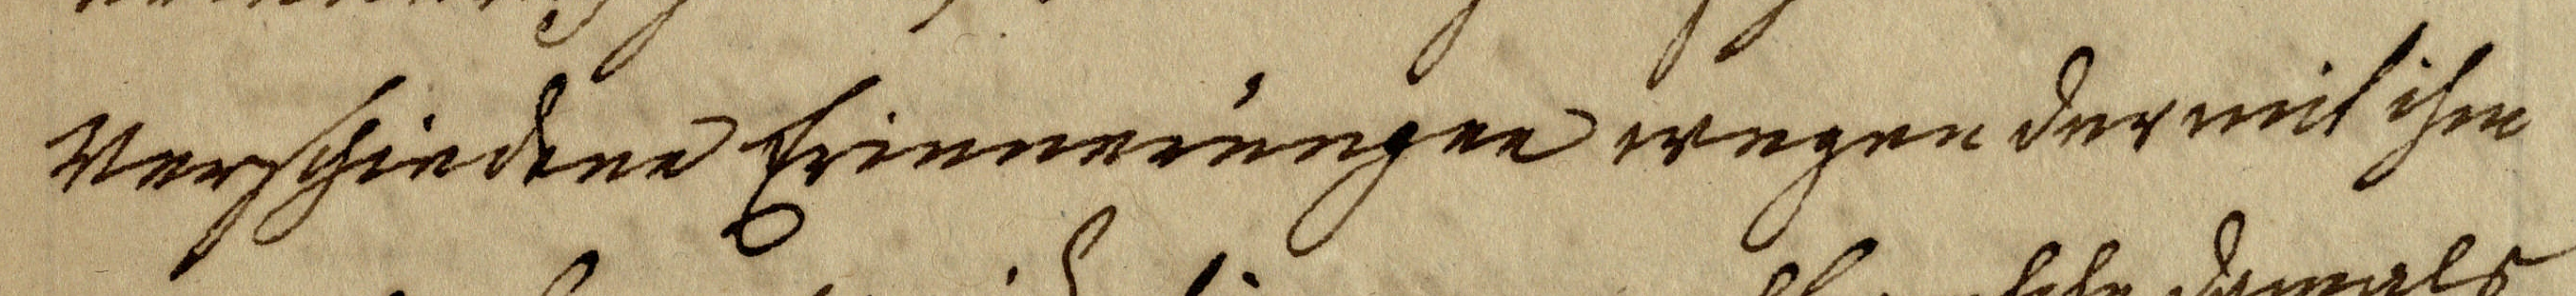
verschiedene Erinnerungen wegen der mit ihm
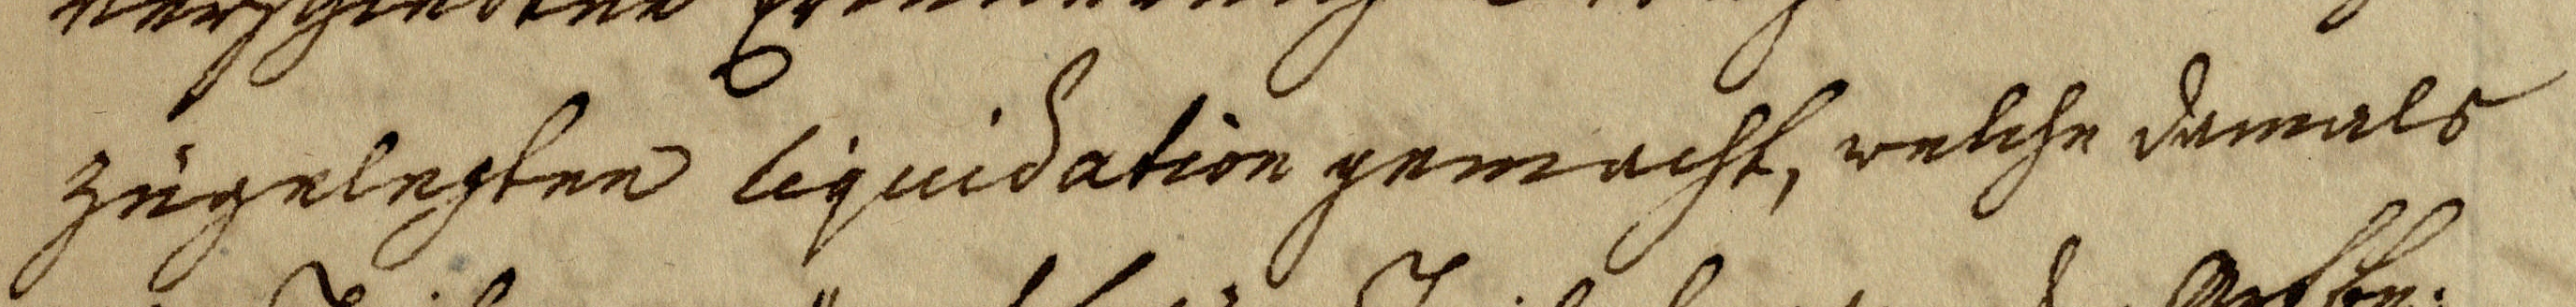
zugelegten liquidation gemacht, welche damals
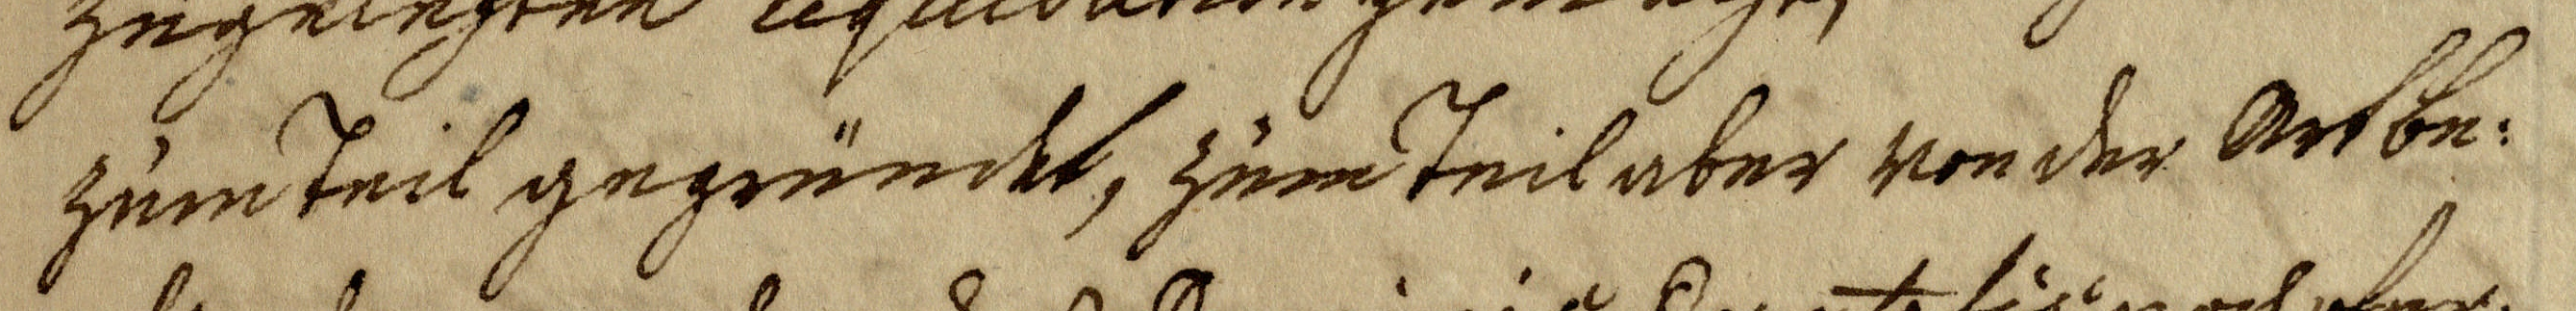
zum Tei gegründet, zum Teil aber von der Art be¬
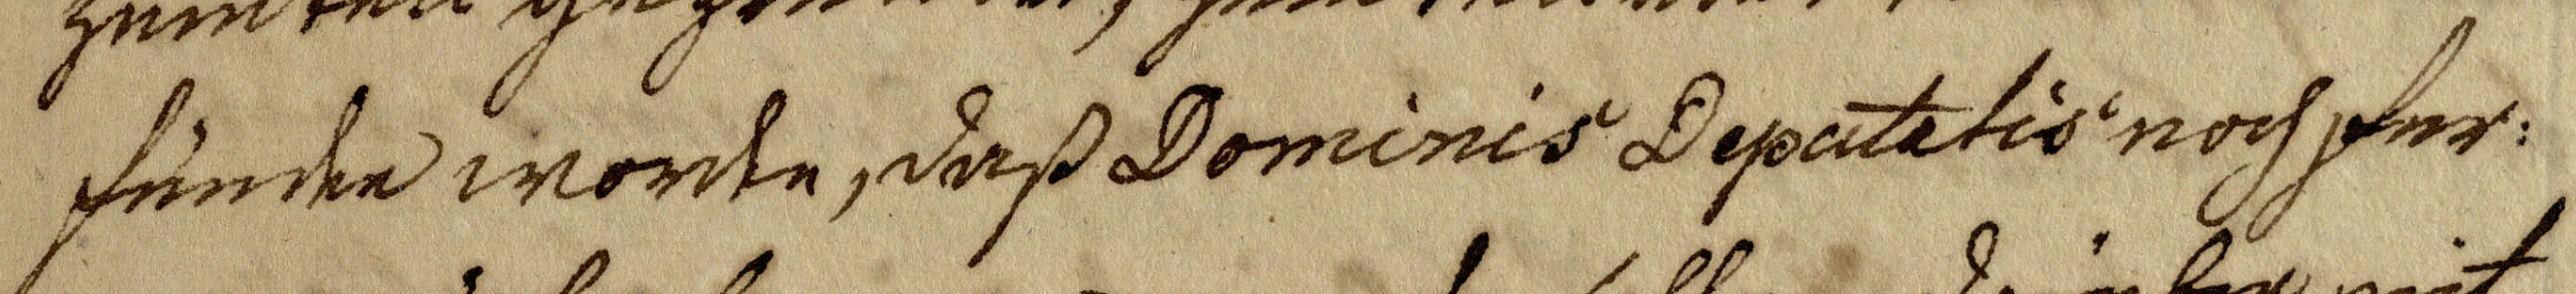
funden worden, daß Domini Deputatis noch fer¬
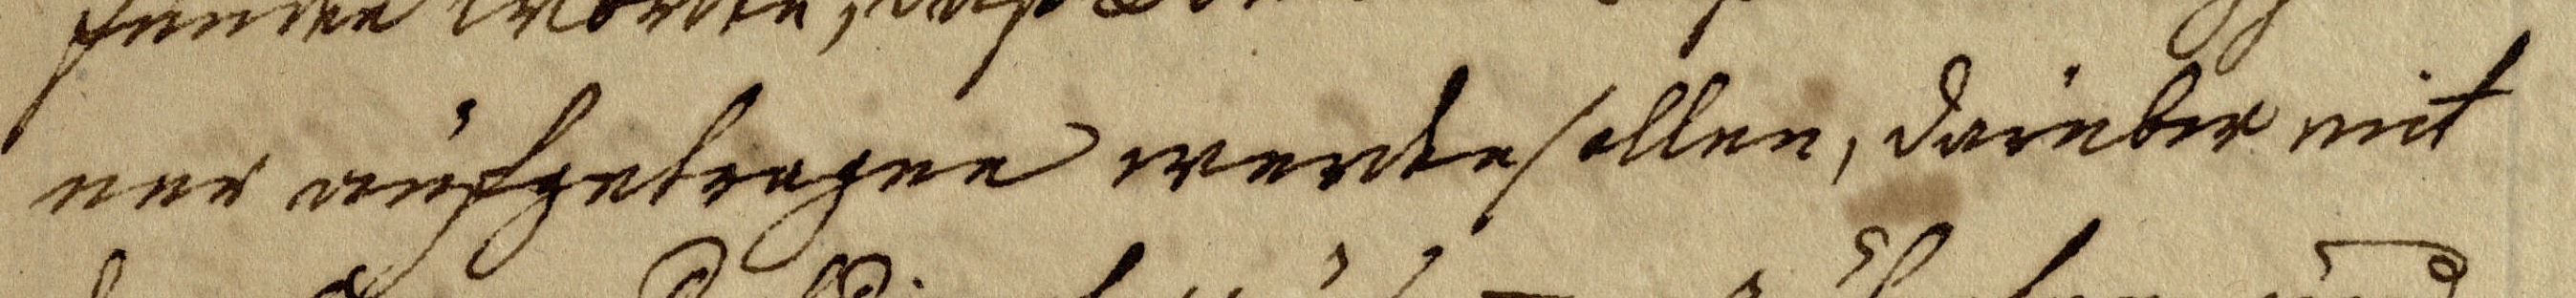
ner aufgetragen werden sollen, darüber mit
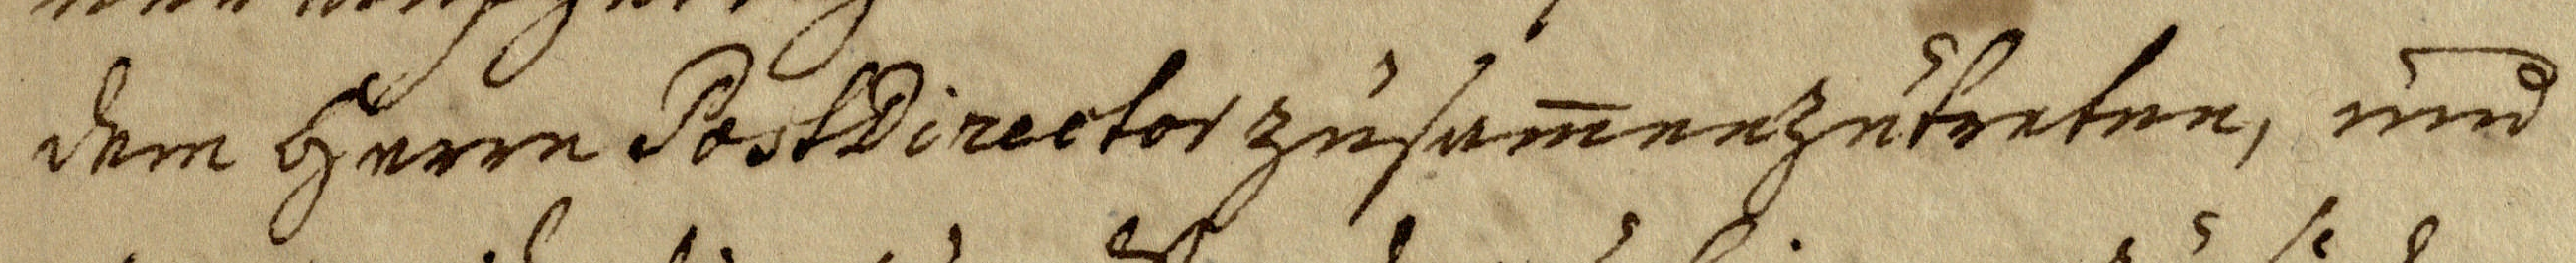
dem Herrn PostDirector zusamenzutreten, und
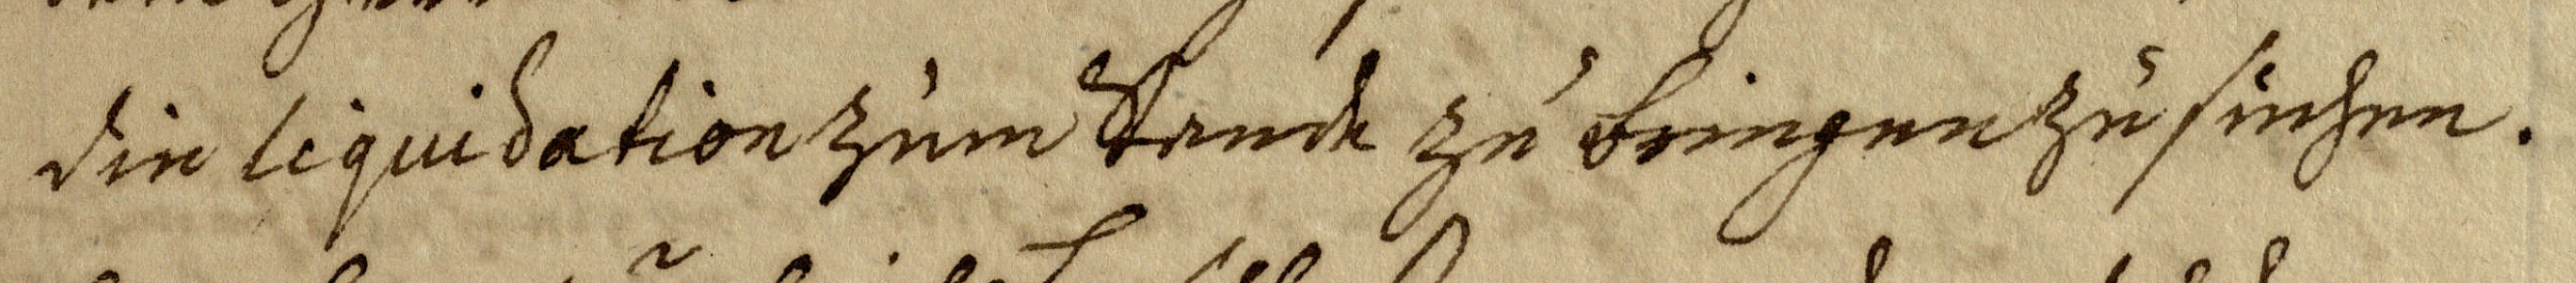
die liquidation zum Stande zu bringen zu suchen.
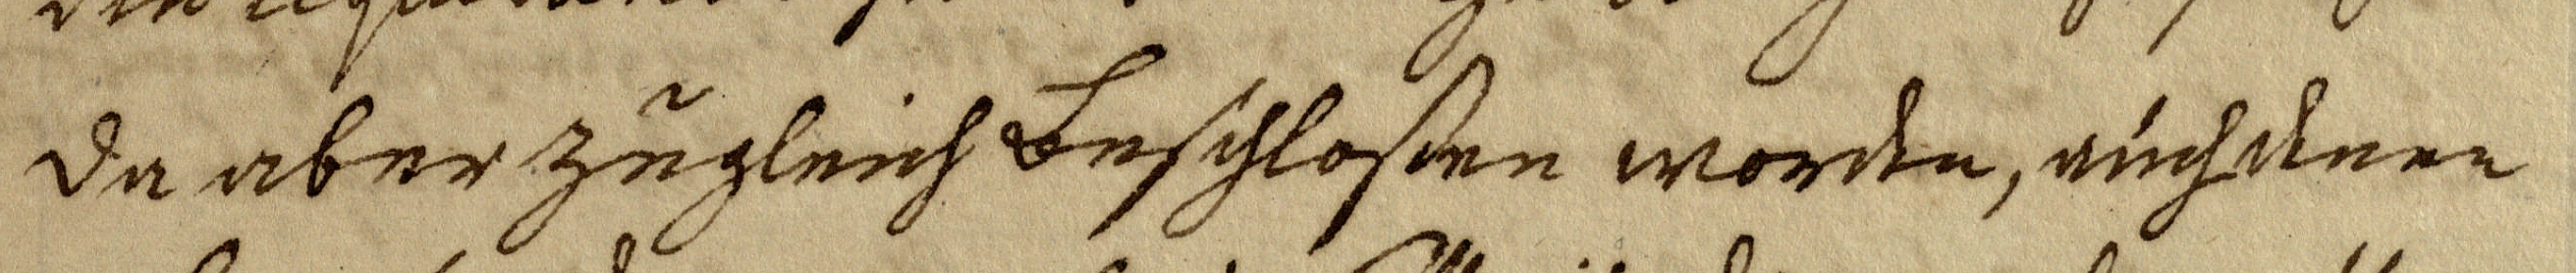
Da aber zugleich beschloßen worden, auch denen
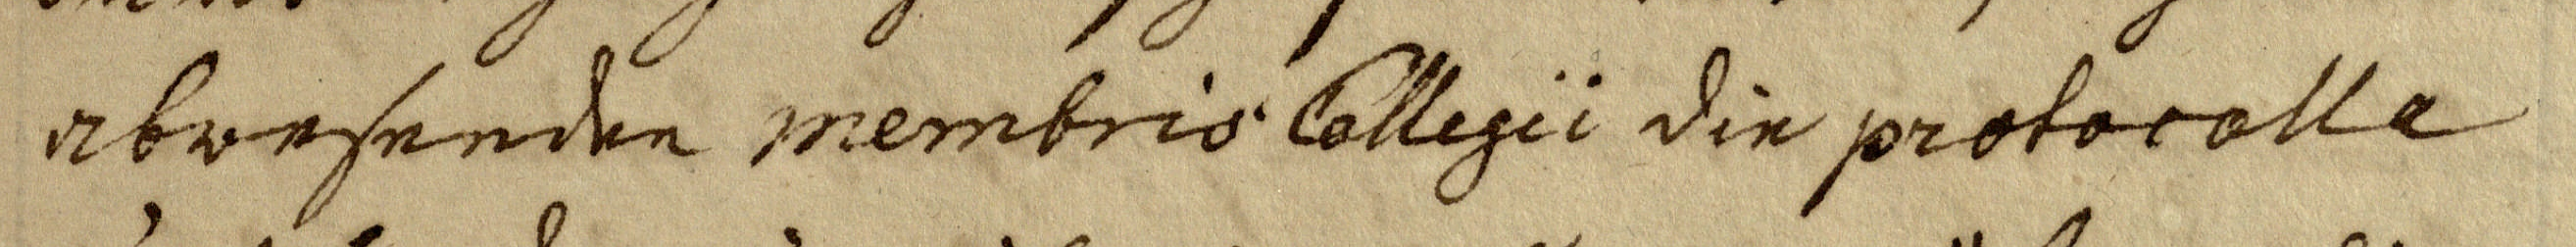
abwesenden membris Collegii die protocolla
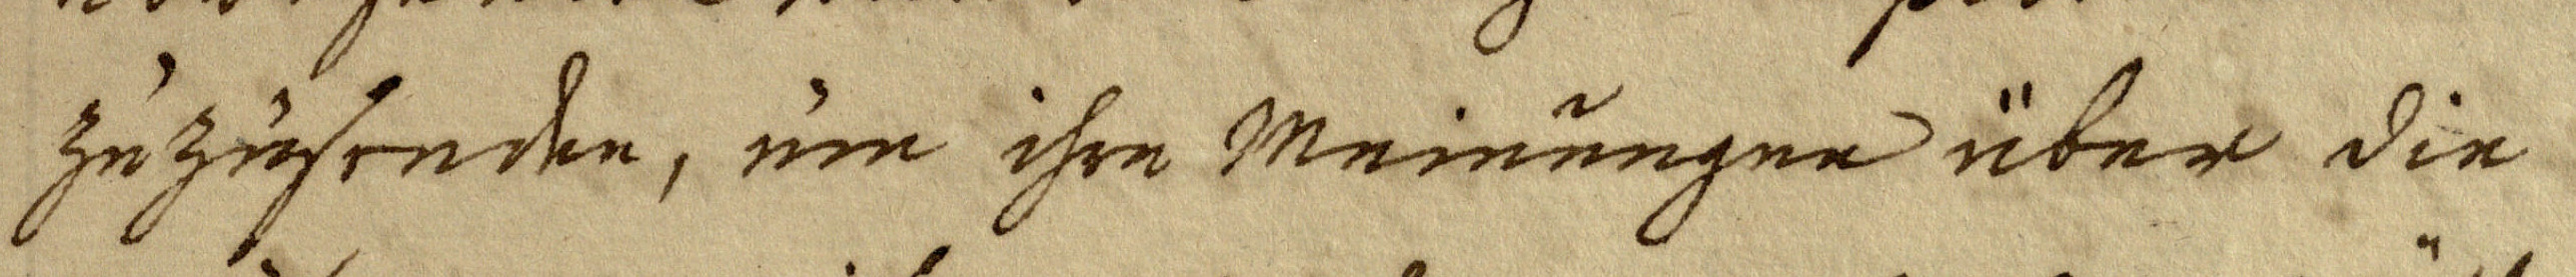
zu zusenden, ein ihre Meinungen über die
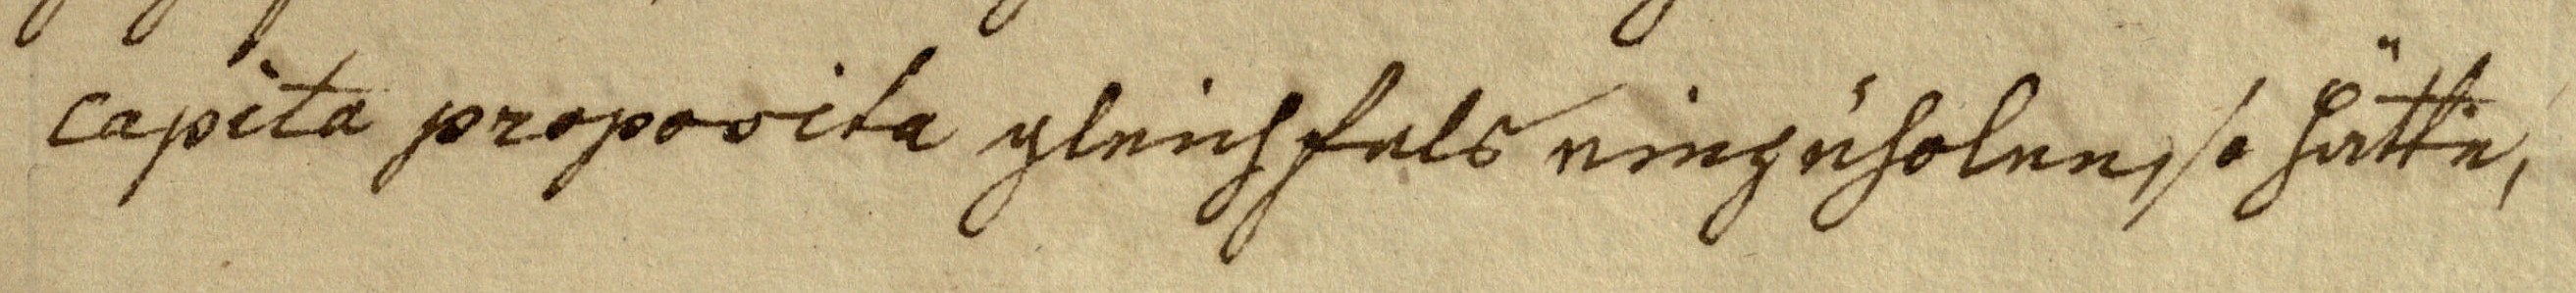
Capita proposita gleichfals einzuholen, so hätte
